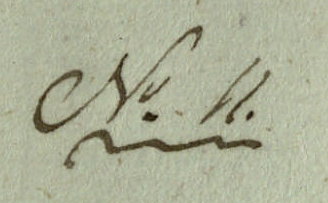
Nº 11.
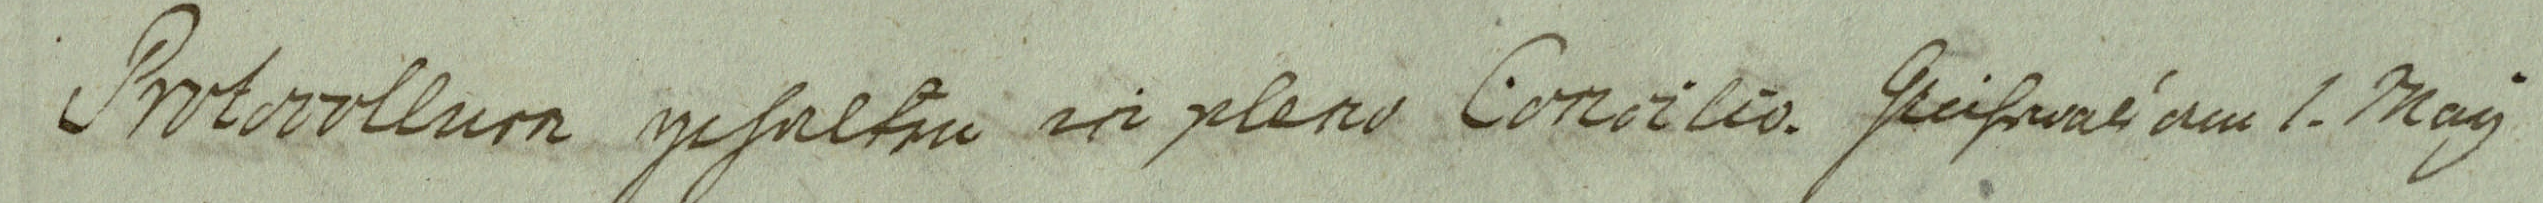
Protocollum gehalten in pleno Concilio. Greifswald am 1. Maÿ
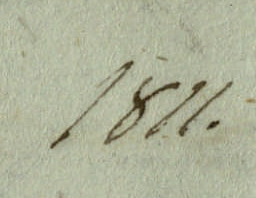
1811.
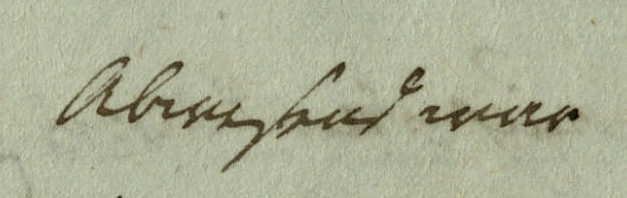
Abwesend war
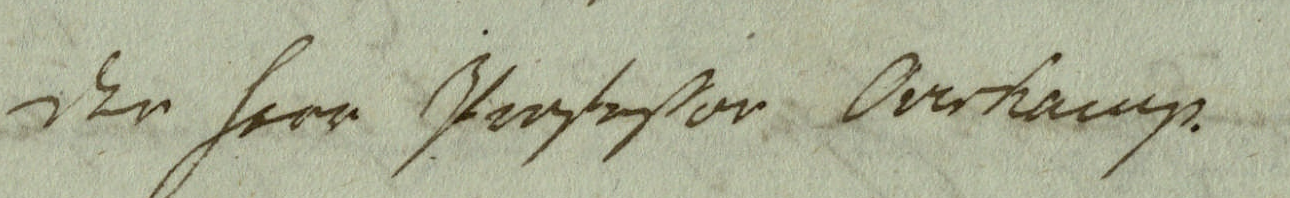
der Herr Professor Overkamp.
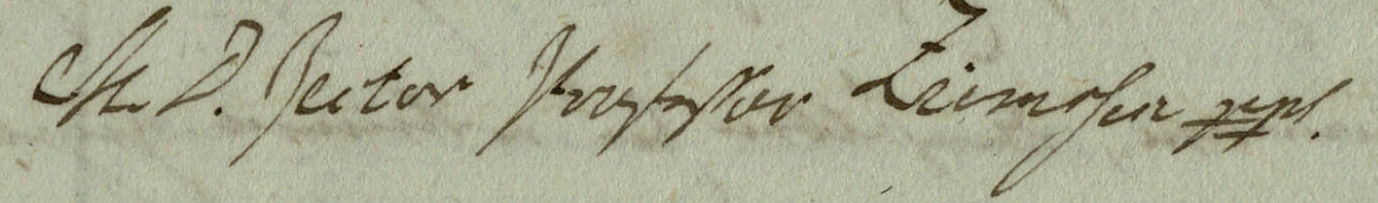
M. D. Rector Professor Ziemssen ppt.
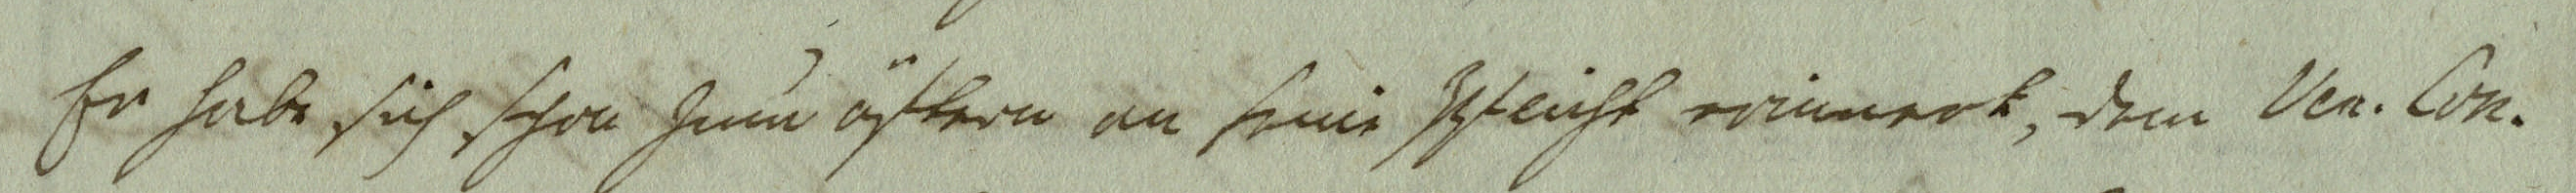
Er habe sich schon zum öftern an seine Pflicht erinnert, dem Ven. Con¬
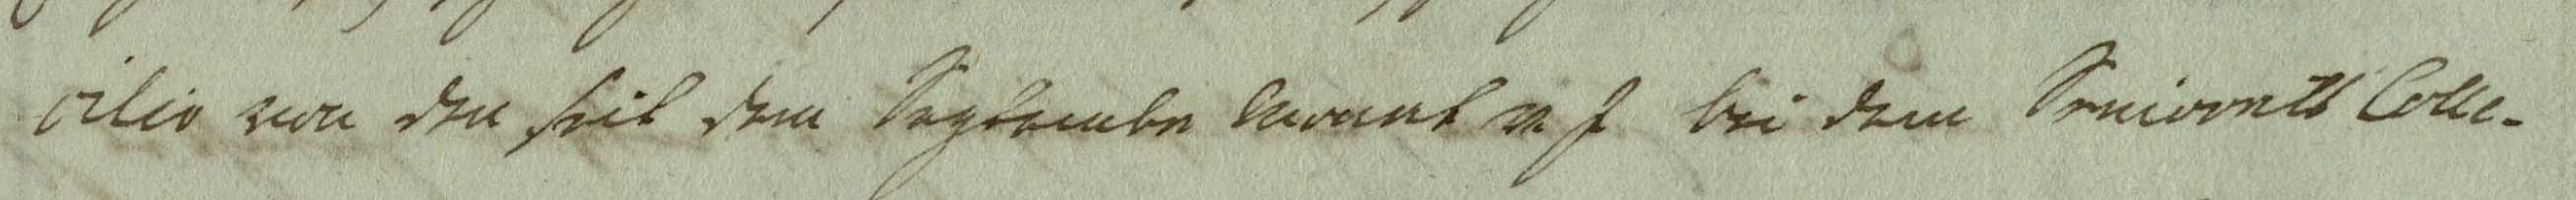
cilio von den seit dem Septembr Monat v. J. bei dem Seniorats Colle¬
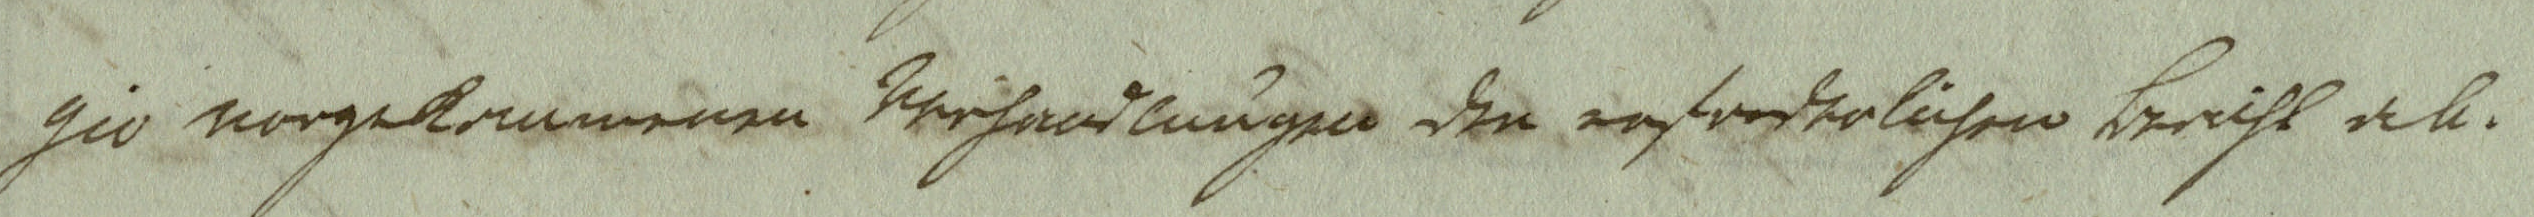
gio vorgekommenen Verhandlungen den erforderlichen Bericht ab¬
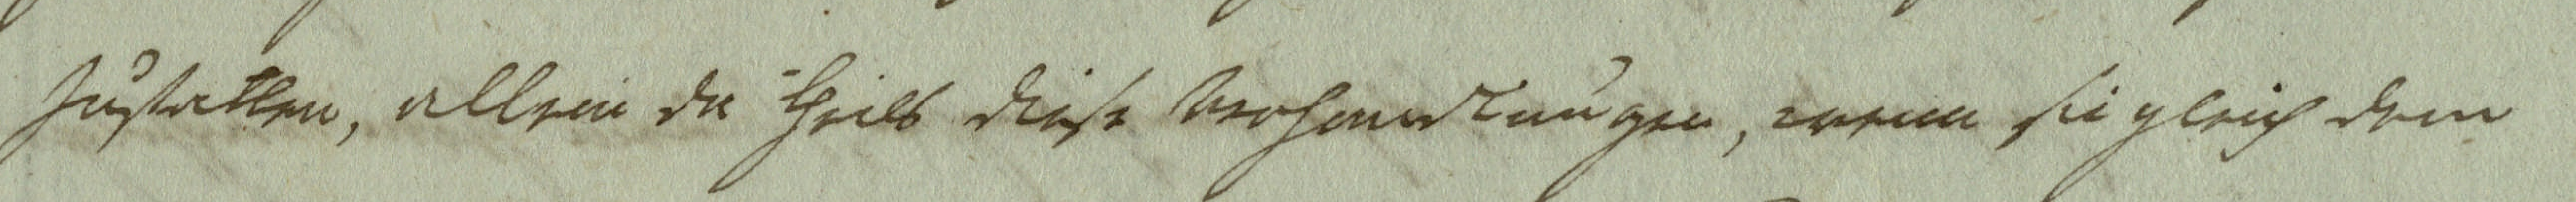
zustatten, allein da theils diese Verhandlungen, wenn sie gleich dem
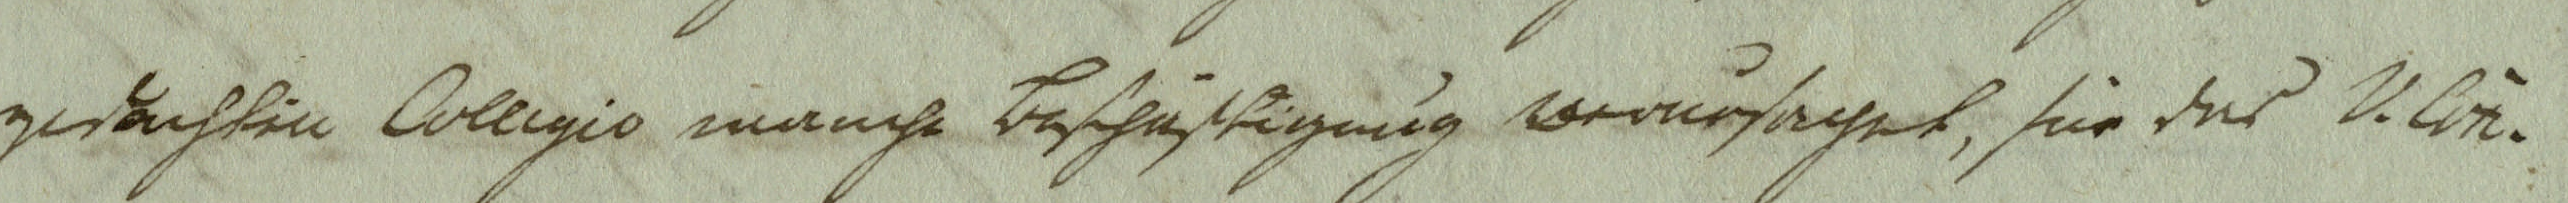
gedachten Collegio manche Beschäftigung verursachet, für das V. Con¬
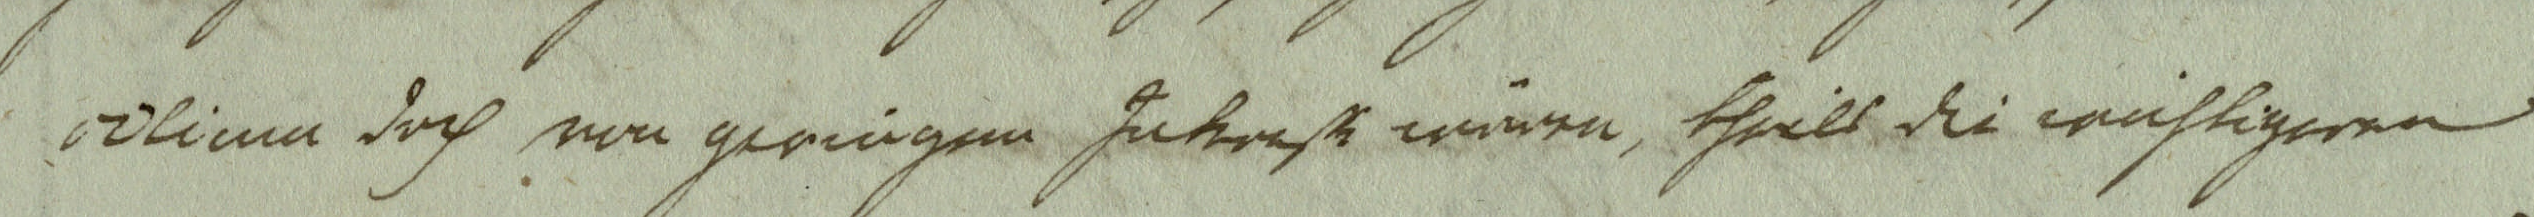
cilium doch von geringem Interesse wären, theils die wichtigeren
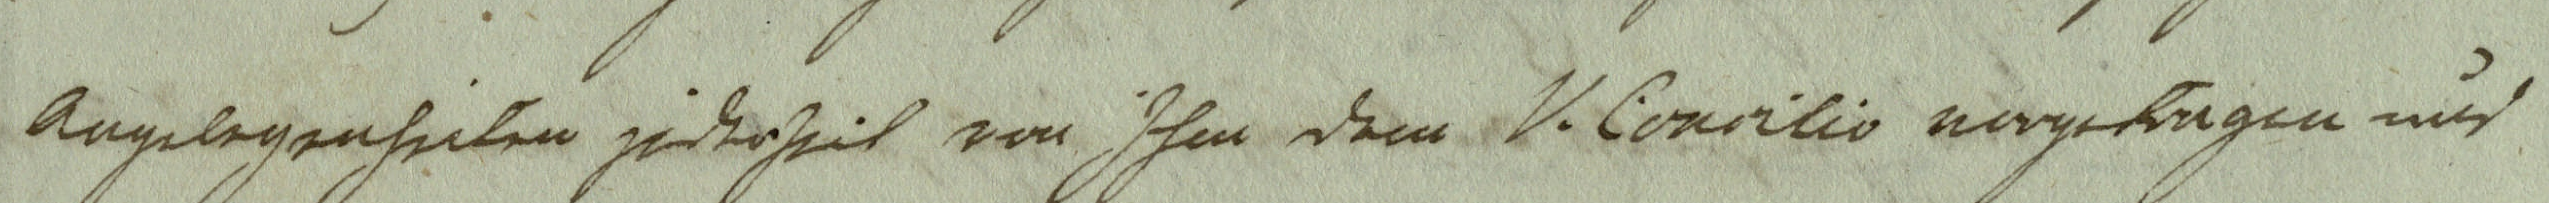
Angelegenheiten jederzeit von Ihm dem V. Concilio vorgetragen und
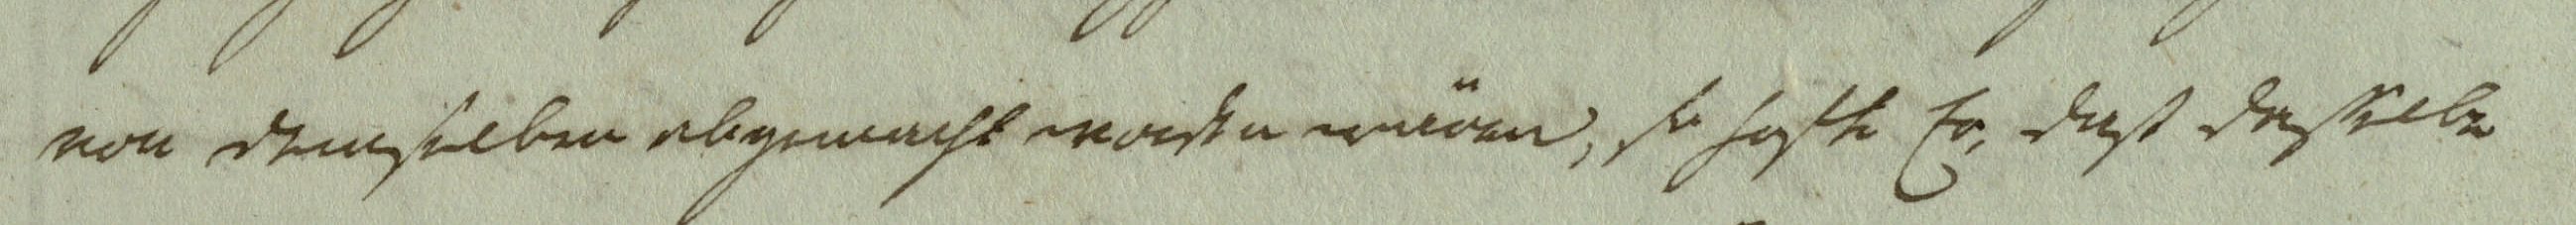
von demselben abgemacht worden wären, so hofte Er, daß dasselbe
